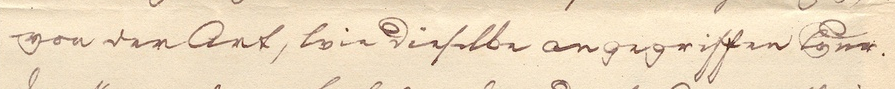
von der Art, wie dieselbe angegriffen wur-
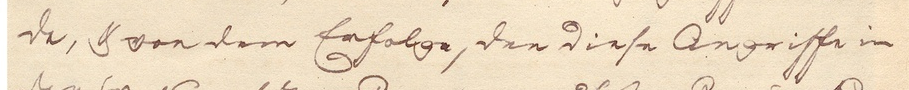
de, & von dem Erfolge, den diese Angriffe in
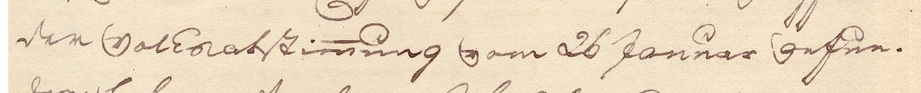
der Volksabstimmung vom 26 Januar gefun-
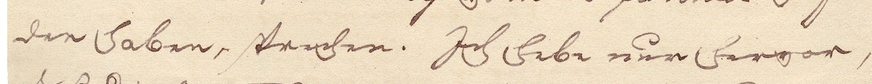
den haben, sprechen. Ich hebe nur hervor,
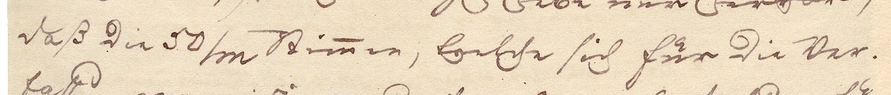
daß die 50/m Stimmen, welche sich für die Ver-
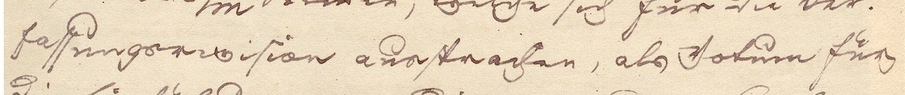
fassungsrevision aussprachen, als Votum für
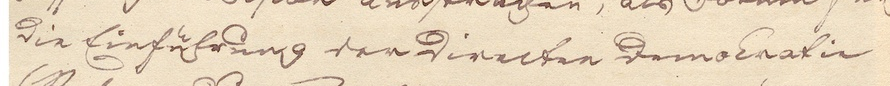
die Einführung der directen Demokratie
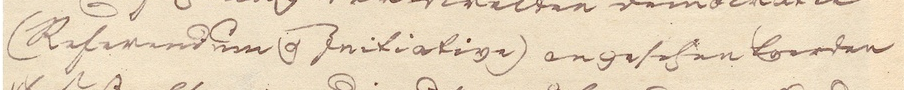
(Referendum & Initiative) angesehen werden
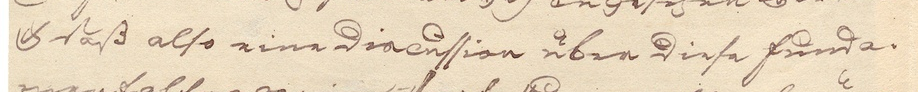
& daß also eine Discussion über diese Funda-
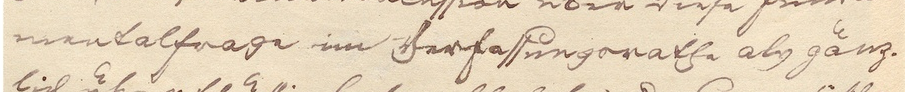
mentalfrage im Verfassungsrathe als gänz-
